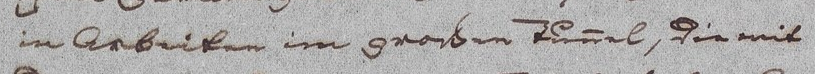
in Arbeiten im großen Tunnel, die mit
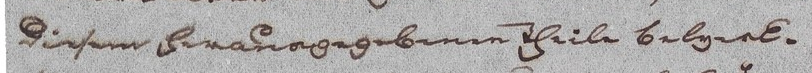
diesem herausgegebenen Theile bewerk-
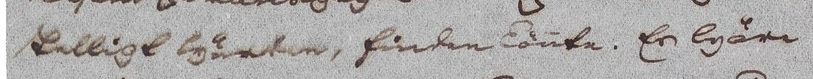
stelligt würden, finden könnte. Es wäre
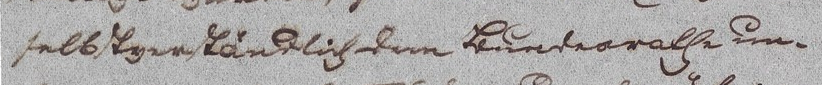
selbstverständlich dem Bundesrathe un-
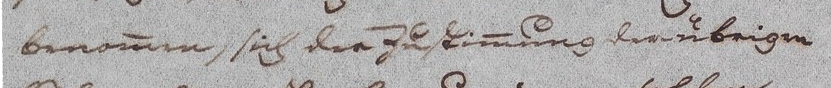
benommen, sich der Zustimmung der übrigen
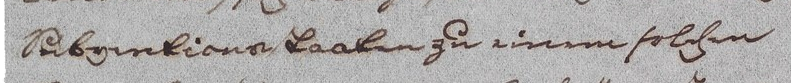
Subventionsstaaten zu einem solchen
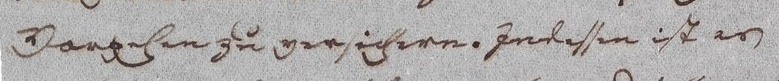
Vorgehen zu versichern. Indessen ist es
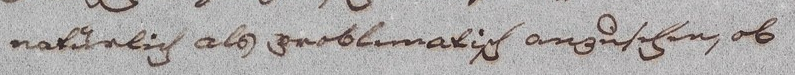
natürlich als problematisch anzusehen, ob
